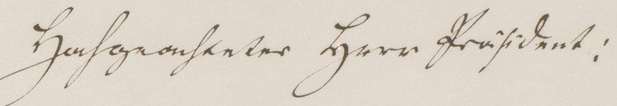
Hochgeachteter Herr Präsident!
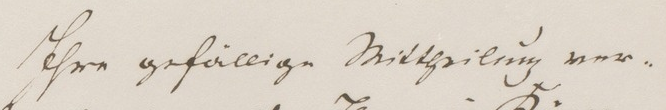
Ihre gefällige Mittheilung ver-
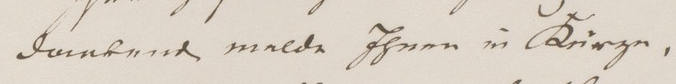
dankend melde Ihnen in Kürze,
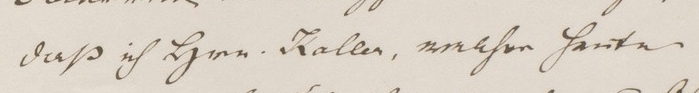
daß ich Hrn. Koller, welcher heute
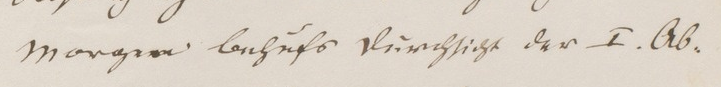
Morgen behufs Durchsicht der I. Ab-
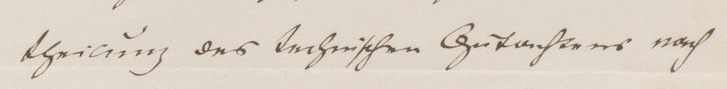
theilung des technischen Gutachtens noch
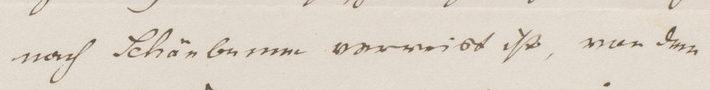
nach Schönbrunn verreist ist, von dem
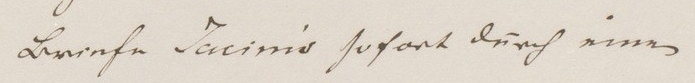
Briefe Jacini's sofort durch einen
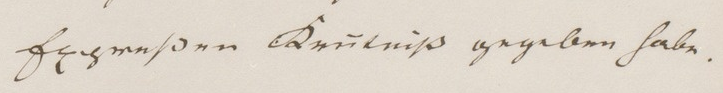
Expressen Kenntniß gegeben habe.
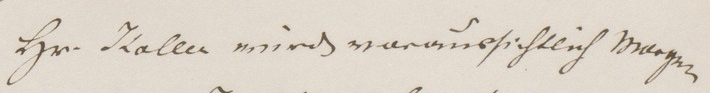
Hr. Koller wird voraussichtlich Morgen
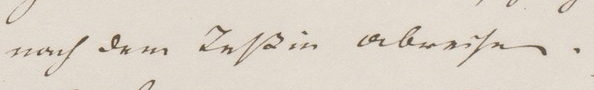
nach dem Teßin abreisen.
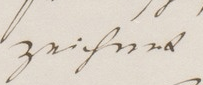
zeichnet
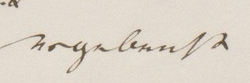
ergebenst
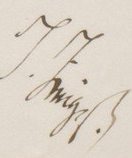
J.
